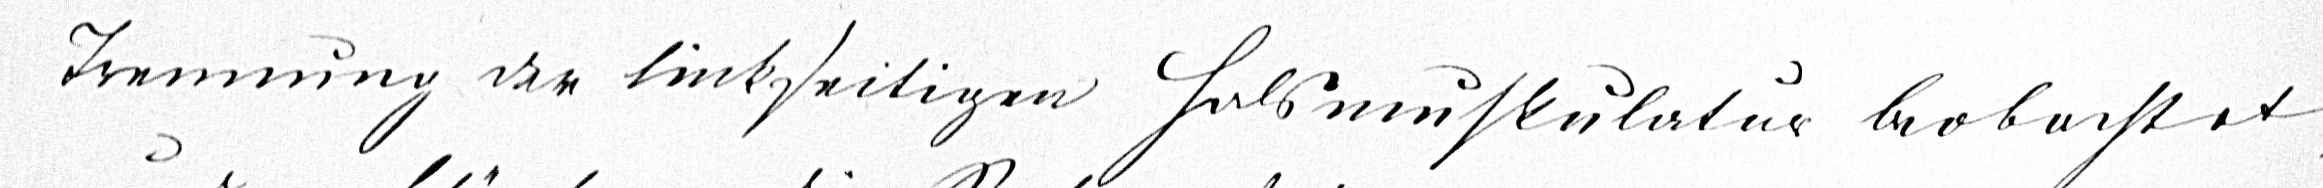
Trennung der linkseitigen Halsmuskulatur beobachtet,
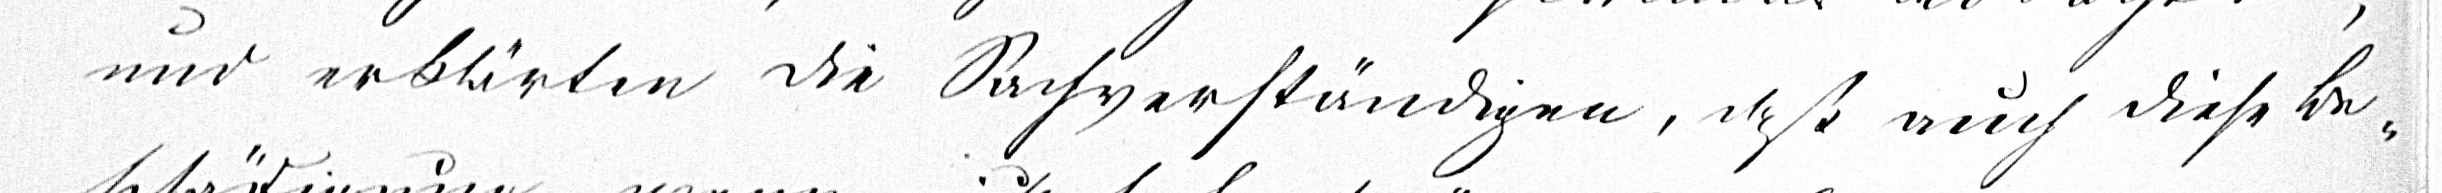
nur erklärten die Sachverständigen, daß auch diese Be¬
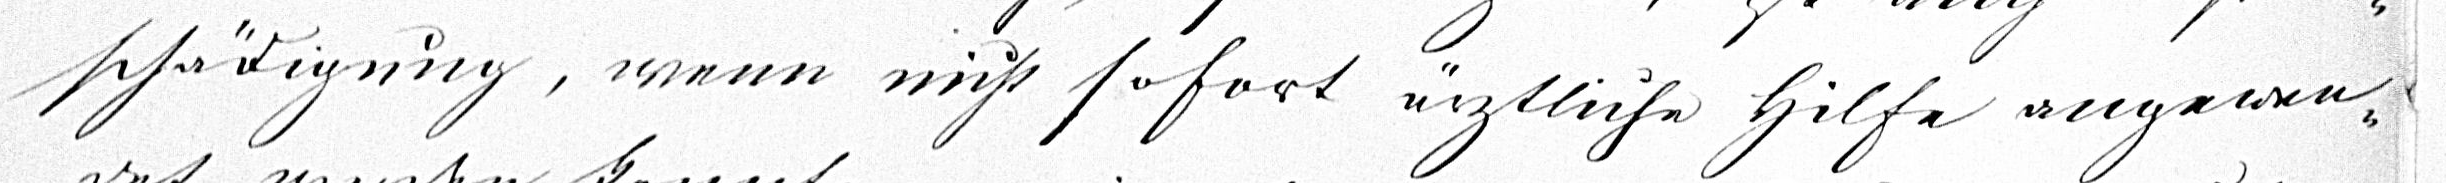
schädigung, wenn nicht sofort ärztliche Hilfe angewen¬
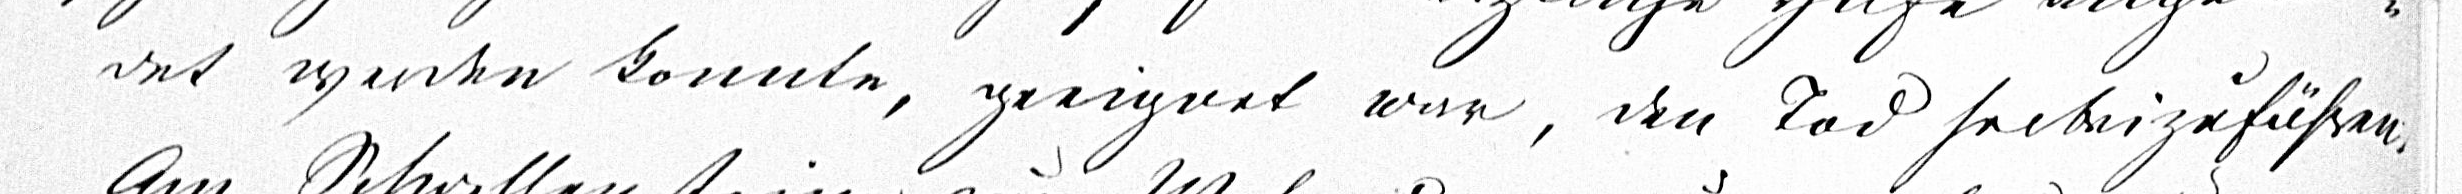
det werden konnte, geeignet war, den Tod herbeizuführen.
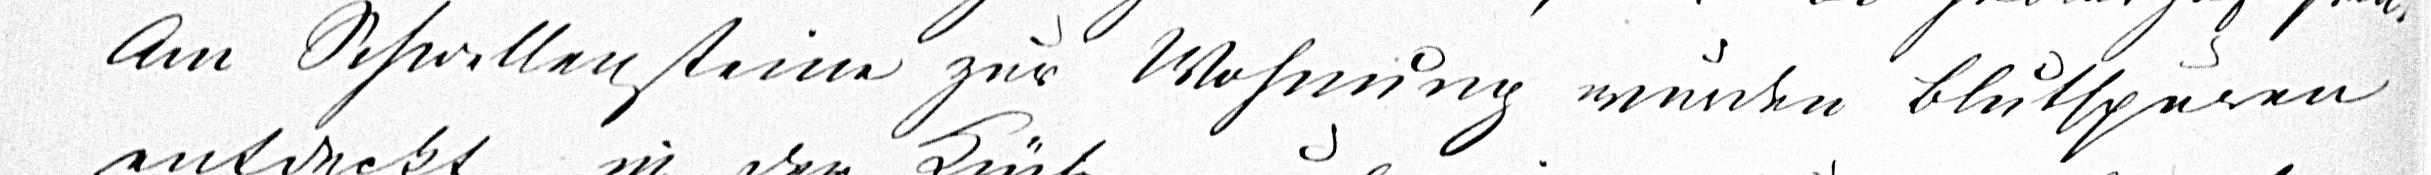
Am Schwellenstein zur Wohnung wurden Blutspuren
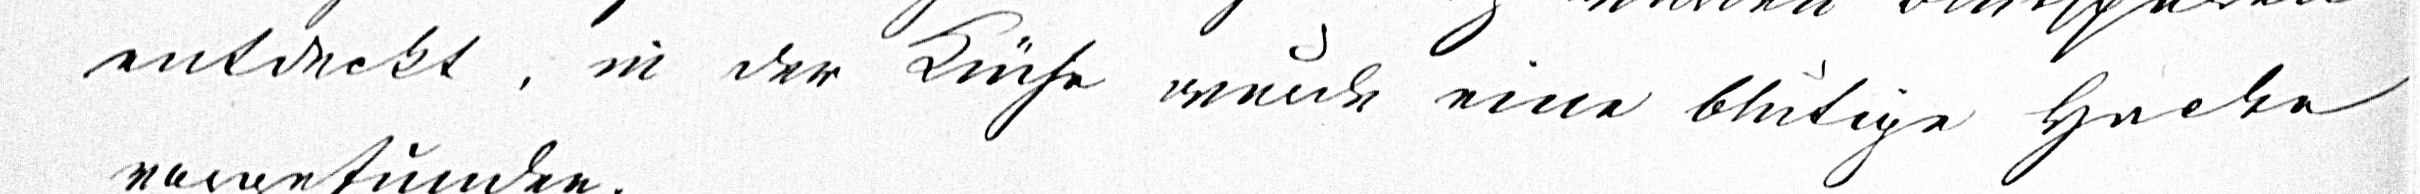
entdeckt, in der Küche wurde eine blutige Hacke
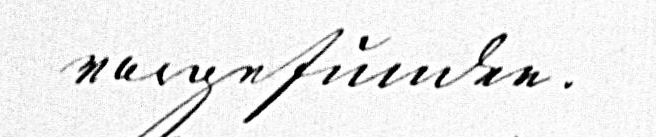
vorgefunden.
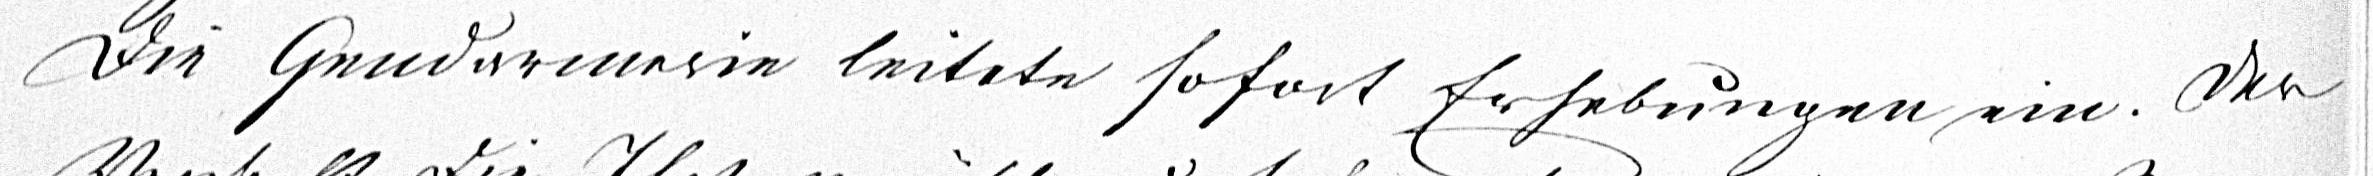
Die Gendarmerie leitete sofort Erhebungen ein. Der
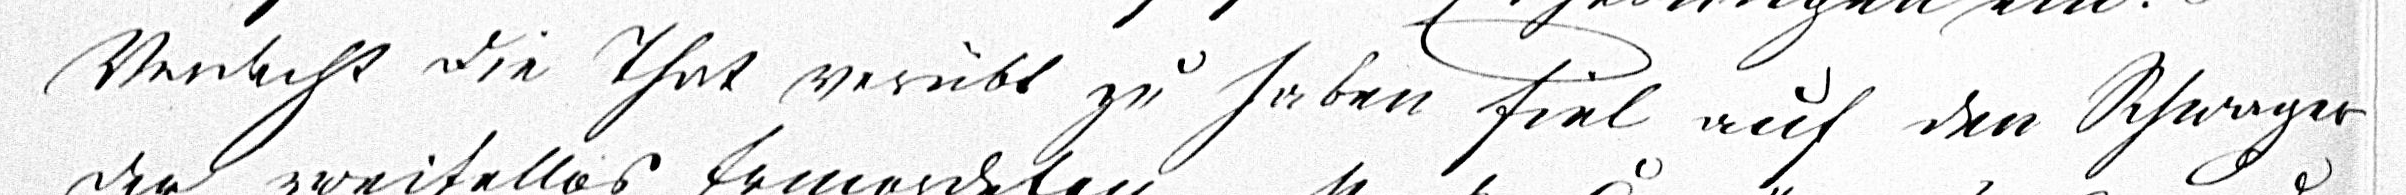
Verdacht die That verübt zu haben fiel auf den Schwager
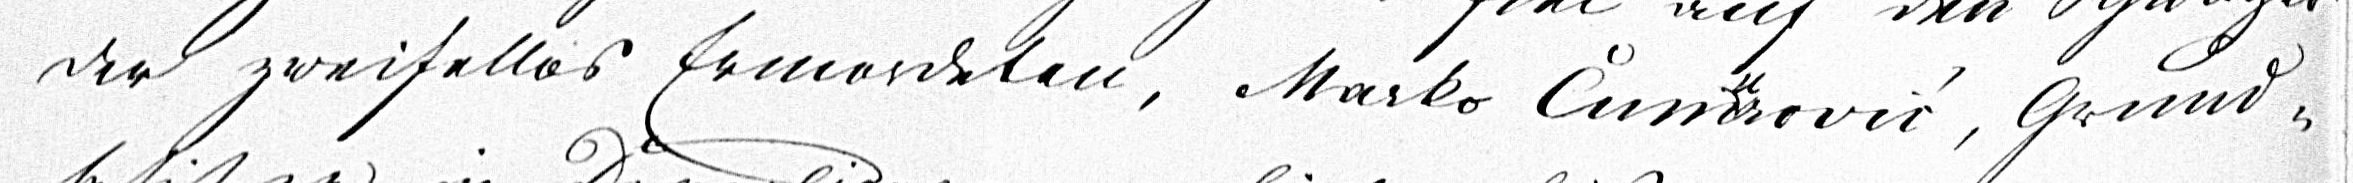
der zweifellos Ermordeten, Marko Cumurović, Grund
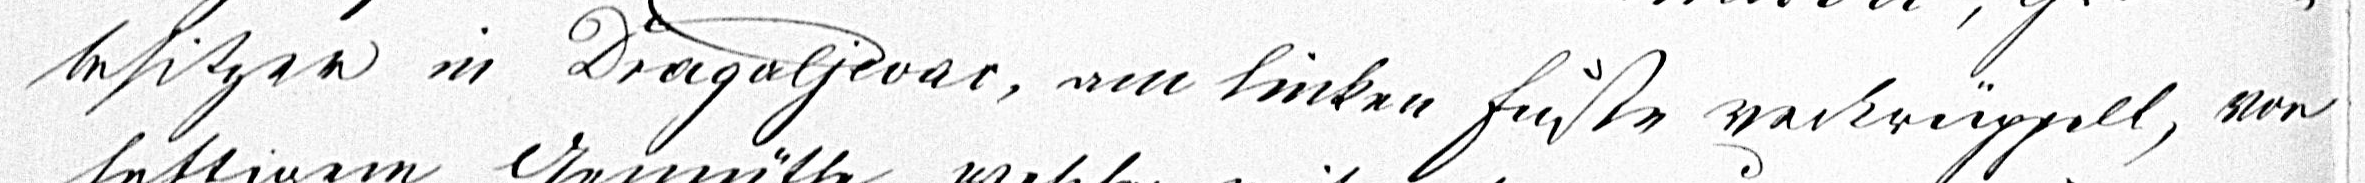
besitzer in Dragoljevac, am linken Fuße verkrüppelt, von
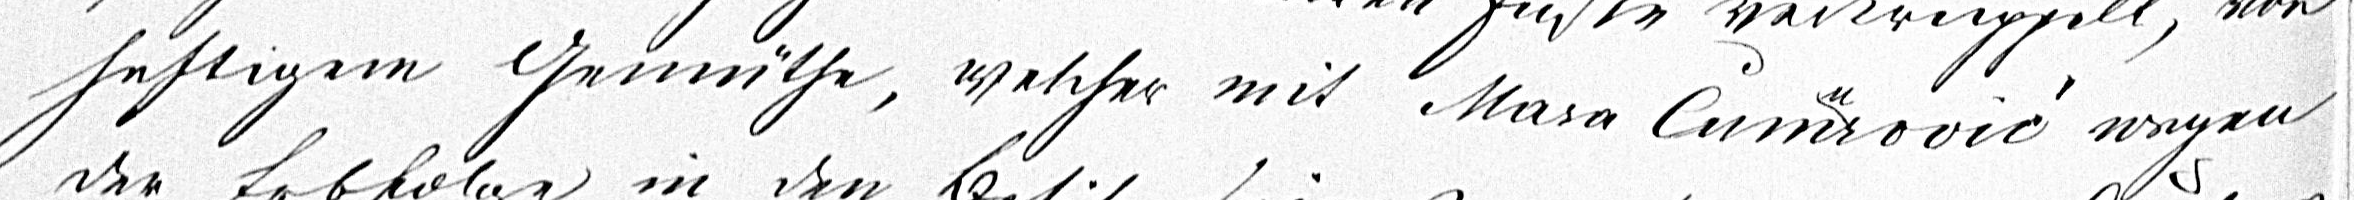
heftigem Gemüthe, welcher mit Mara Cumurović wegen
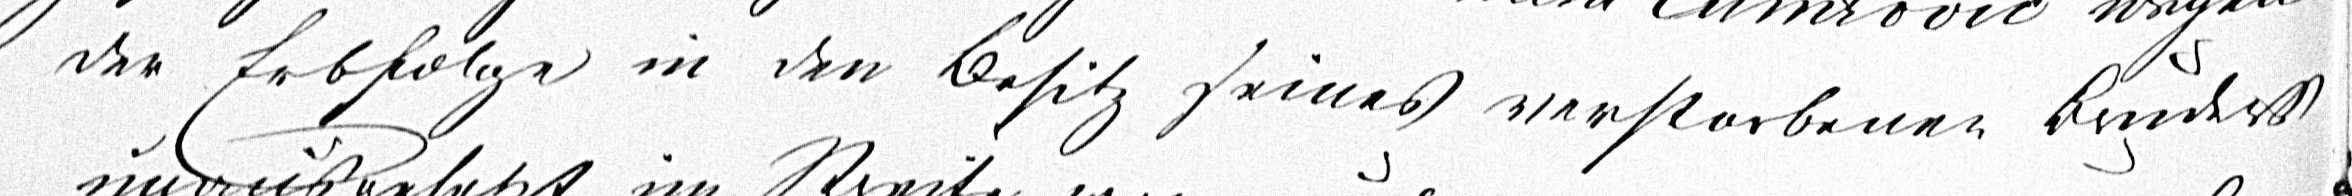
der Erbfolge in den Besitz seines verstorbene Bruders
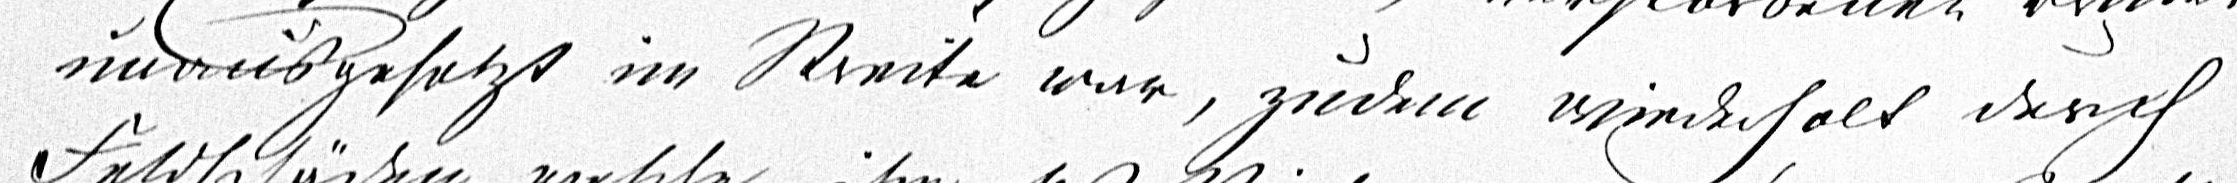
unausgesetzt im Streite war, zudem wiederholt durch
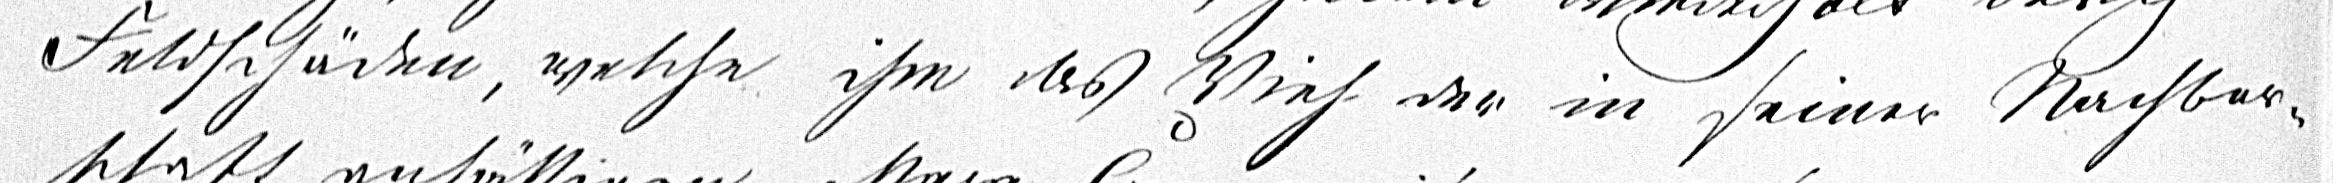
Feldschäden, welche ihm das Vieh der in seiner Nachbar¬
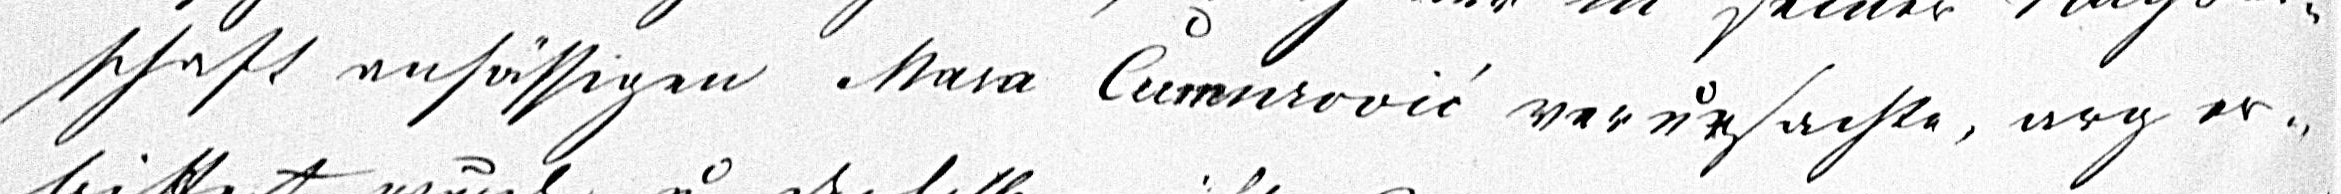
schaft ansässigen Mara Cumurović verursachte, arg er¬
